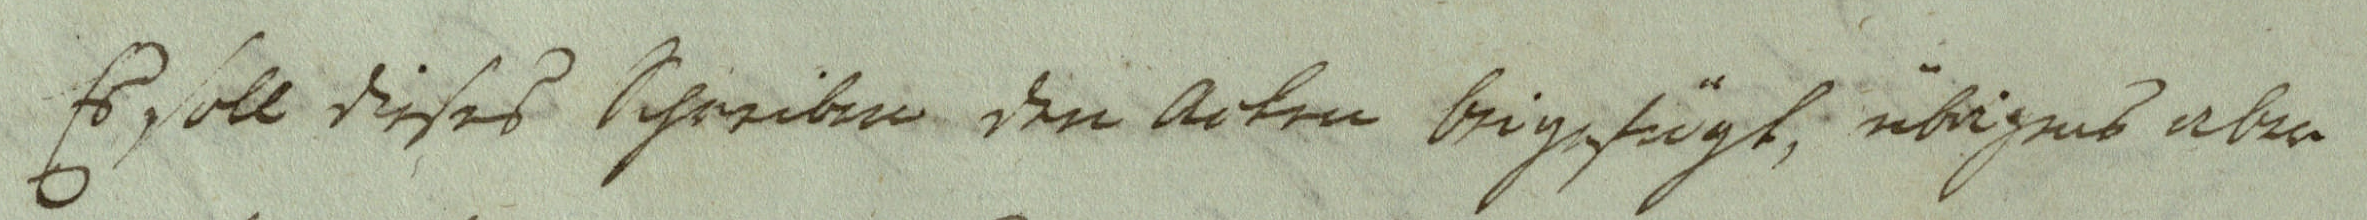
Es soll dieses Schreiben den Acten beigefügt, übrigens aber
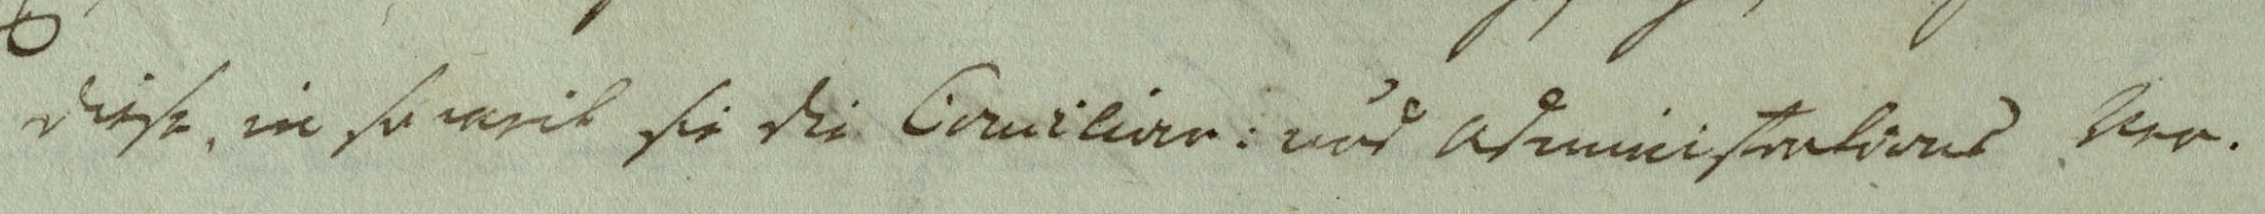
diese, in so weit sie die Conciliar- und Administrations Ver¬
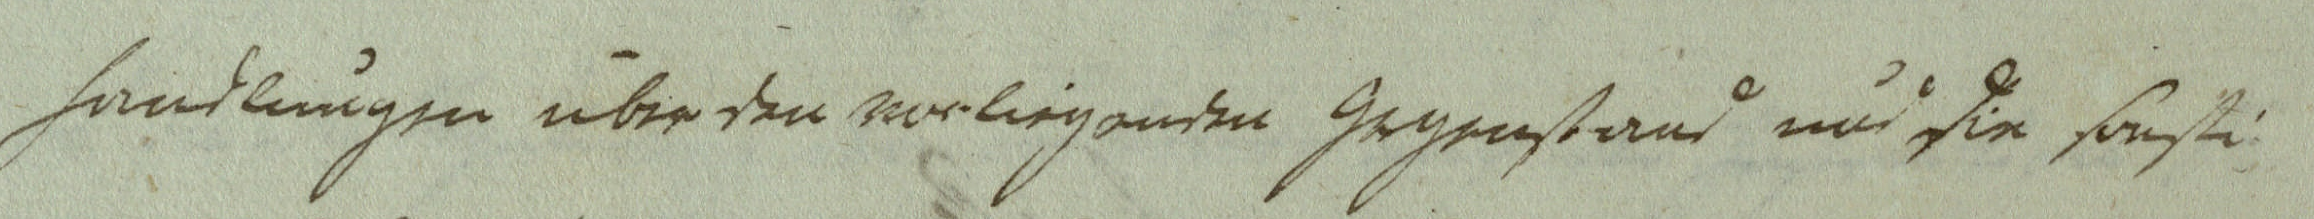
handlungen über den vorliegenden Gegenstand und die sonsti¬
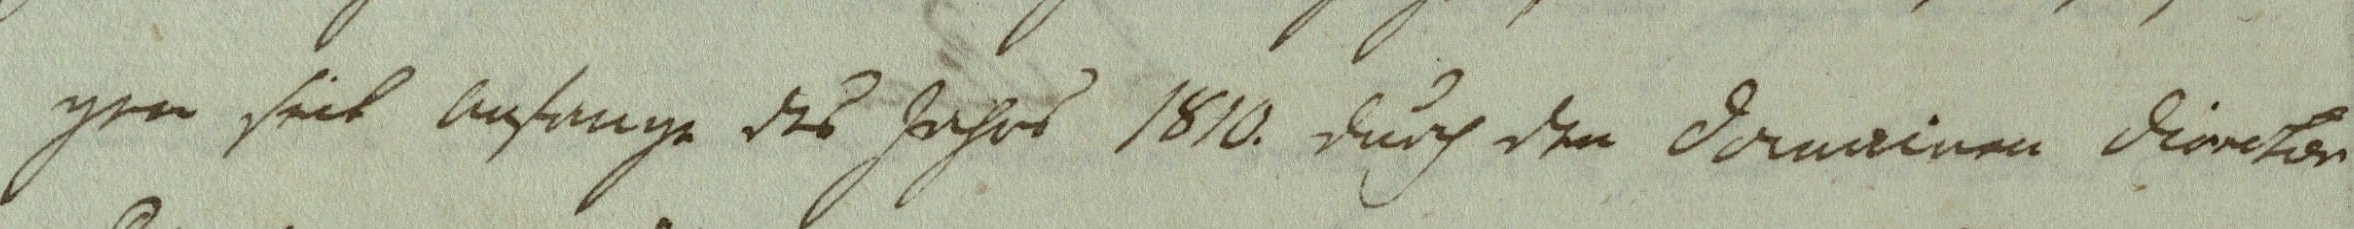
gen seit Anfange des Jahres 1810. durch den Domainen Director
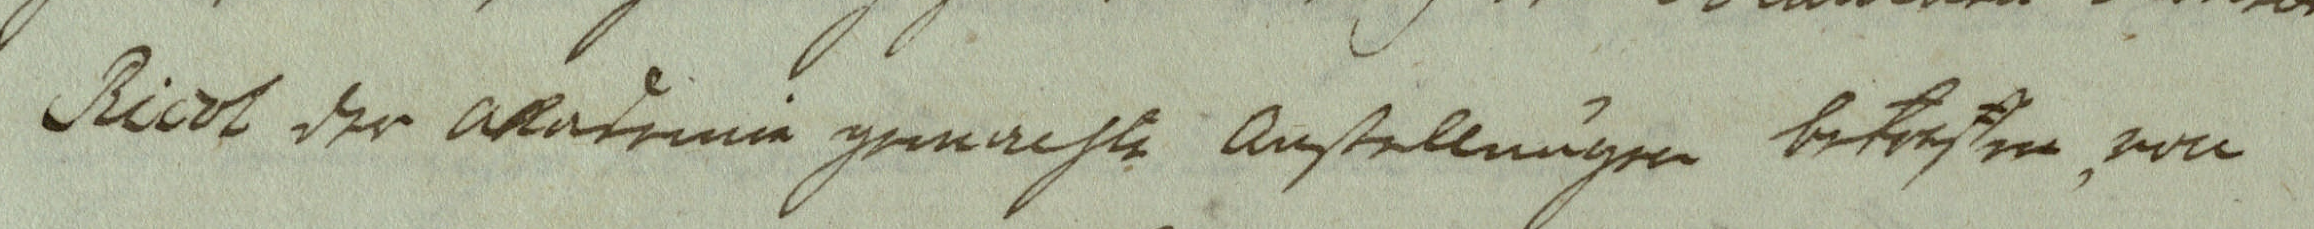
Ricot der Akademie gemachte Anstellungen betreffen, von
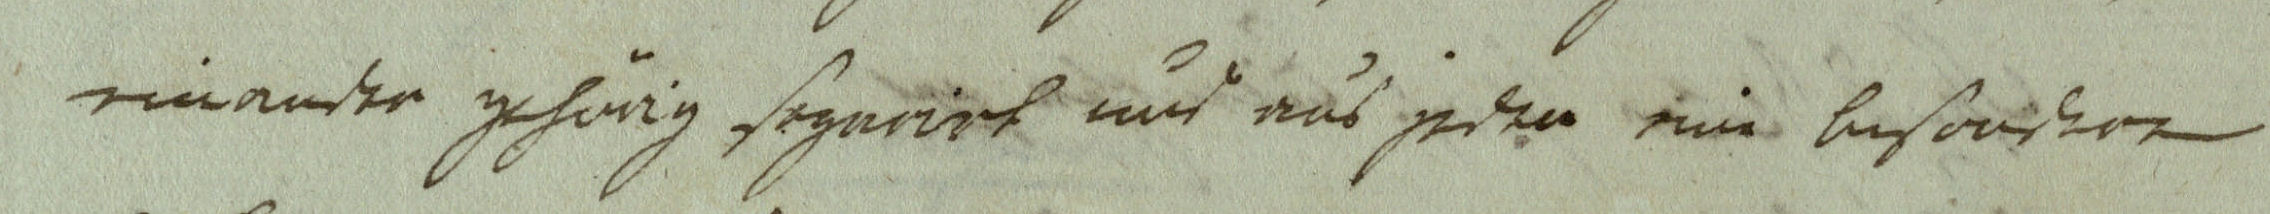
einander gehörig separirt und aus jedem eine besondere
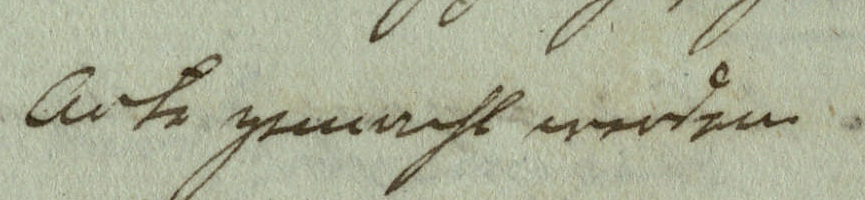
Acte gemacht worden.
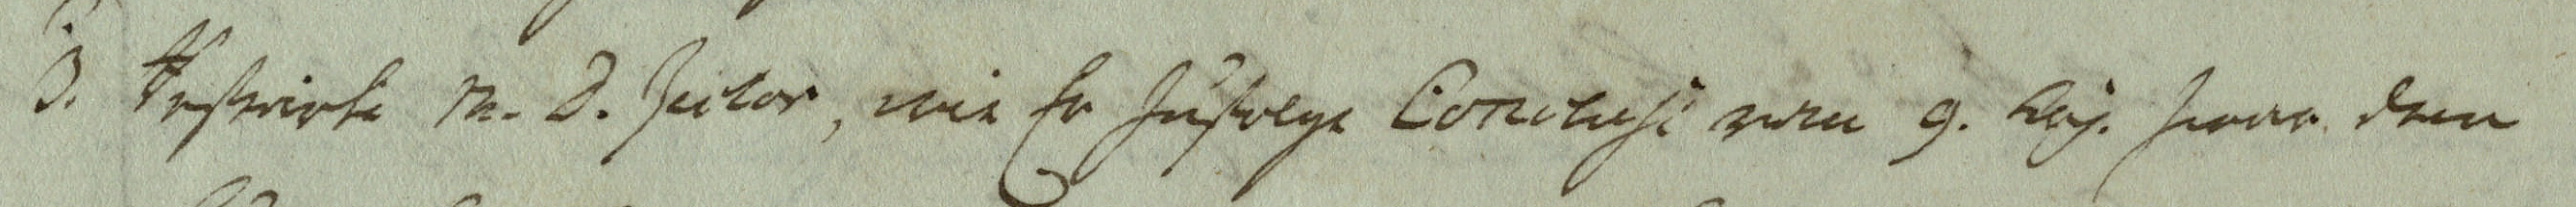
3. Referirte M. D. Rector, wie Er zufolge Conclusi vom 9. huj. zwar dem
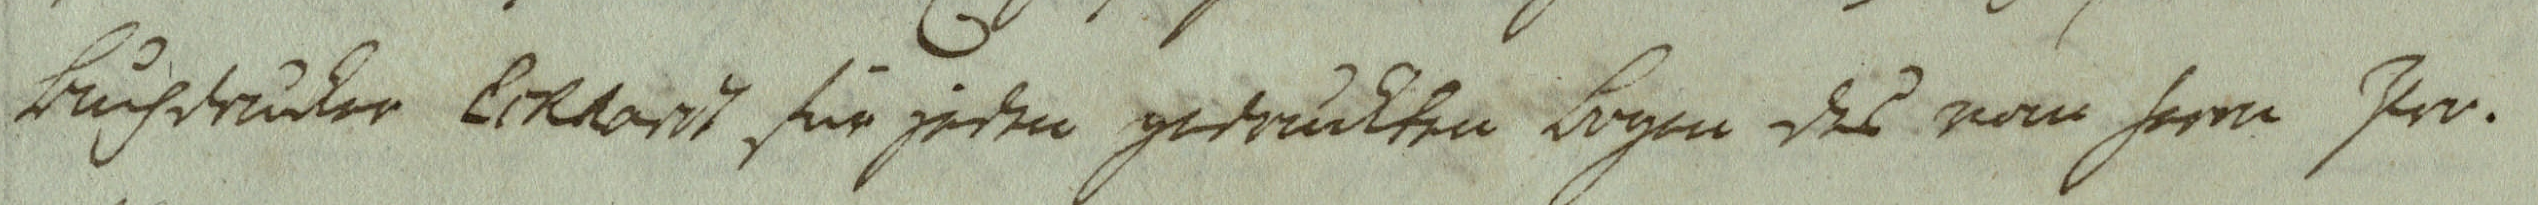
Buchdrucker Eckhardt für jeden gedruckten Bogen des vom Herrn Prof¬
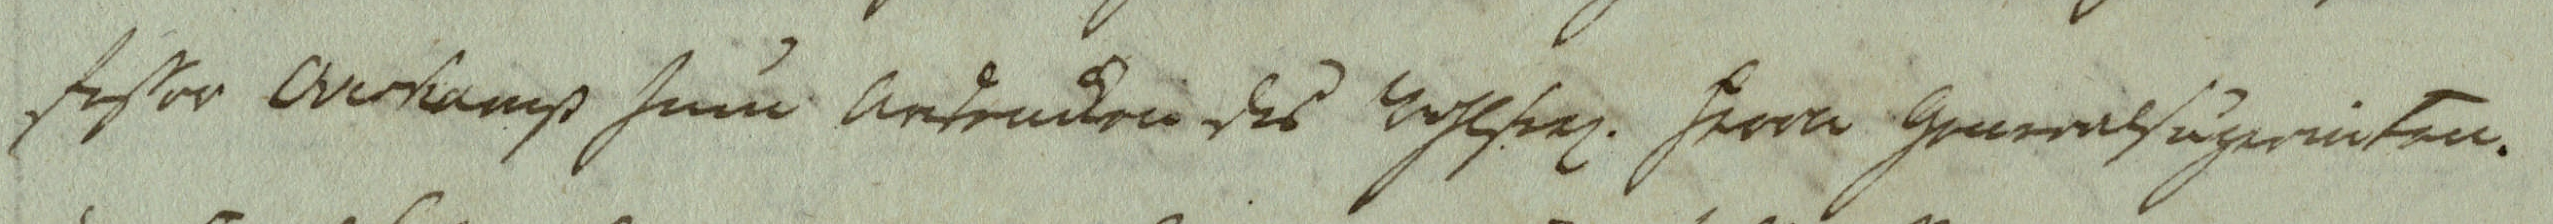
fessor Overkamp zum Andencken des Wohlseel. Herrn Generalsuperinten¬
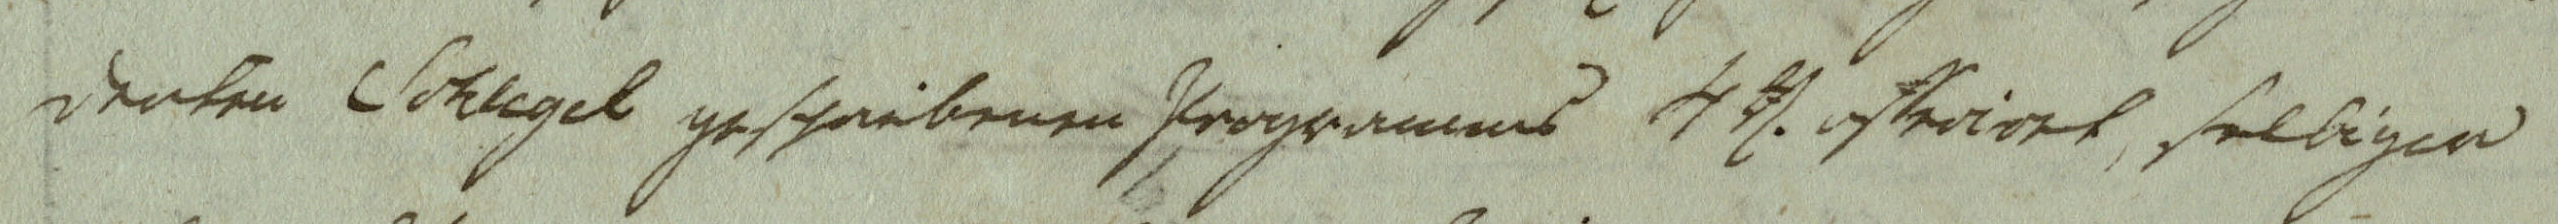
denten Schlegel geschriebenen Programms 4 Rt. offeriret, selbiger
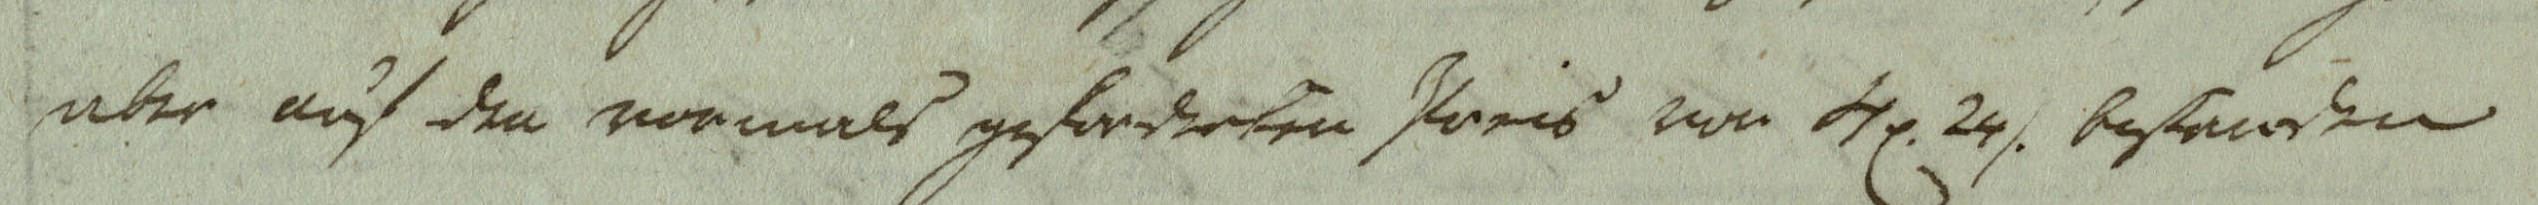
aber auf den vormals geforderten Preis von 4 l. 24 s. bestanden
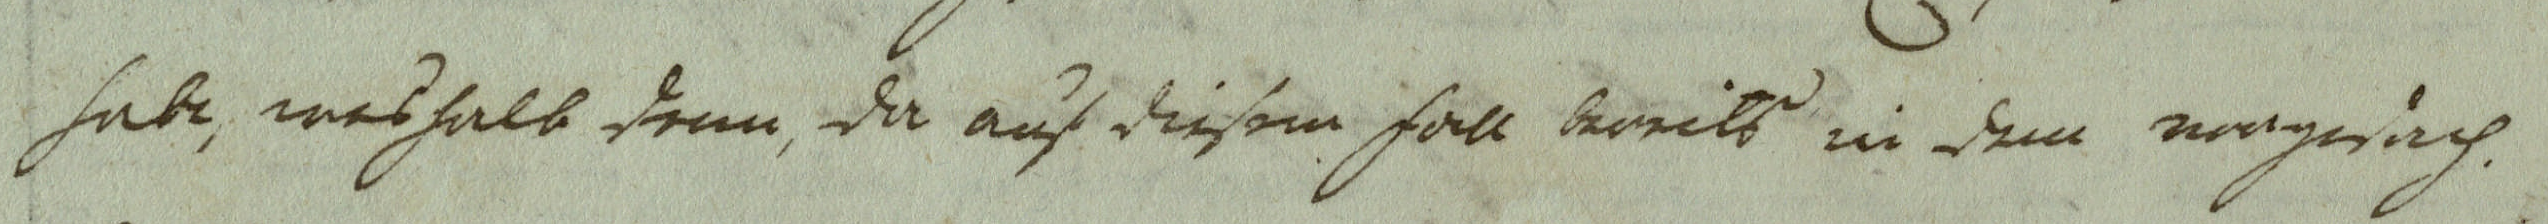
habe, weshalb denn, da auf diesem Fall bereits in dem vorgedach¬
